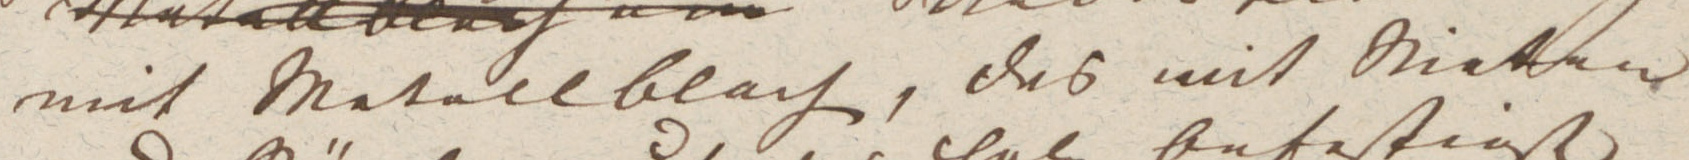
mit Metallblech, das mit Nieten
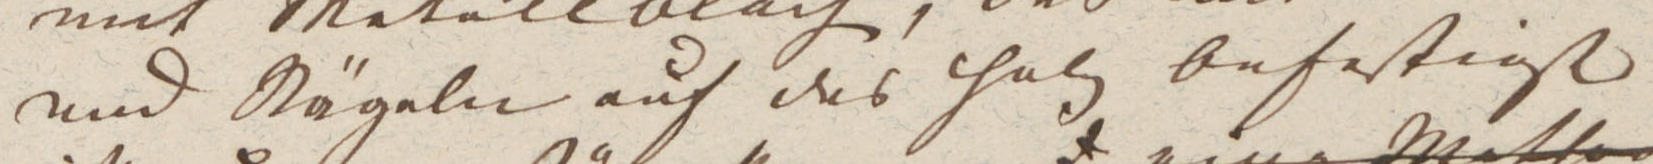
und Nägeln auf das Holz befestigt
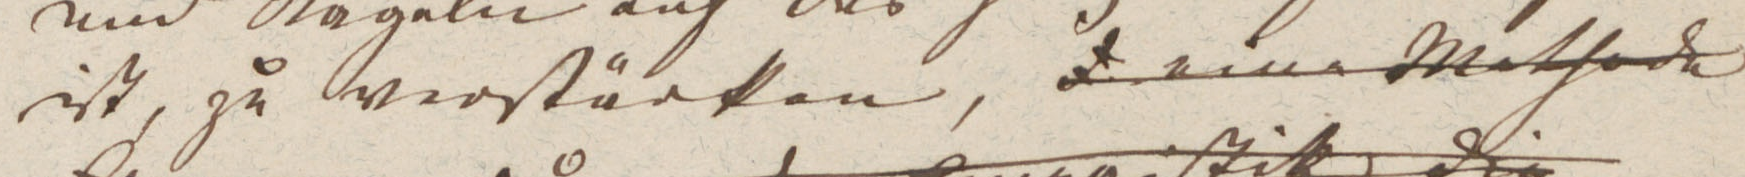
ist, zu verstärken, d. eine Methode
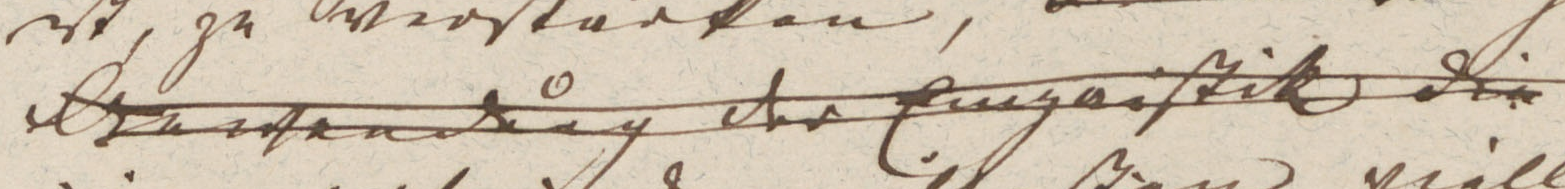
Anwendung der Empaistik die
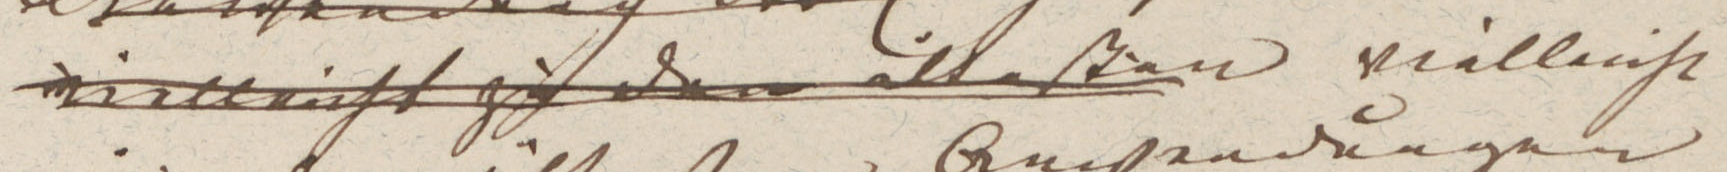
vielleicht zu den ältesten vielleicht
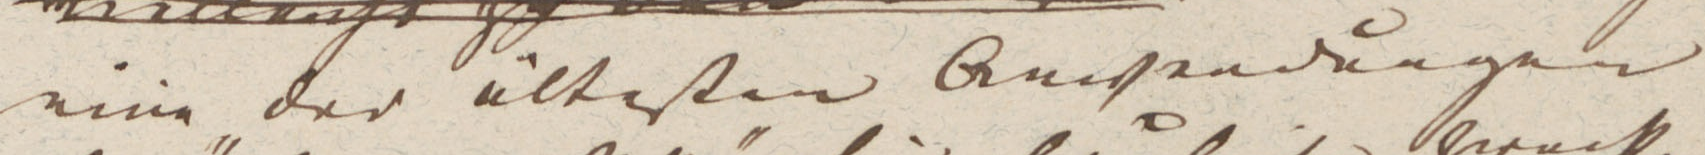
eine der ältesten Anwendungen
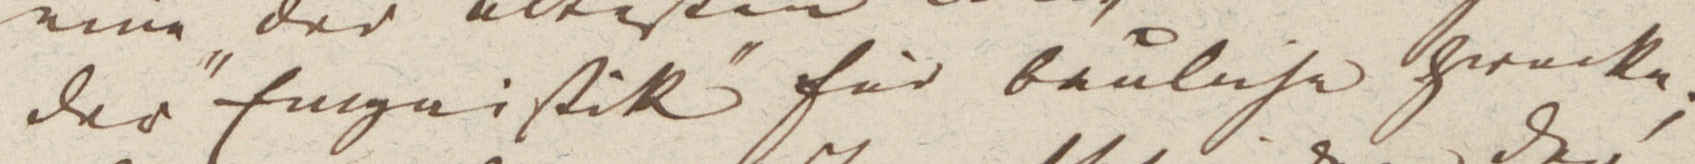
der "Empaistik" für bauliche Zwecke;
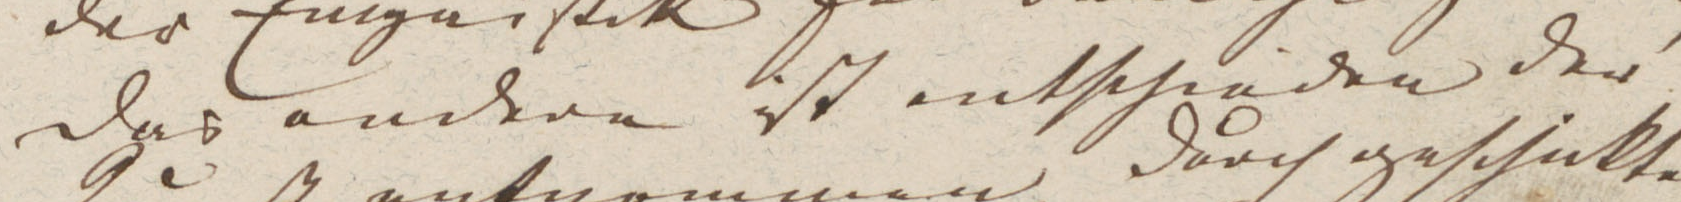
Das andere ist entschieden der
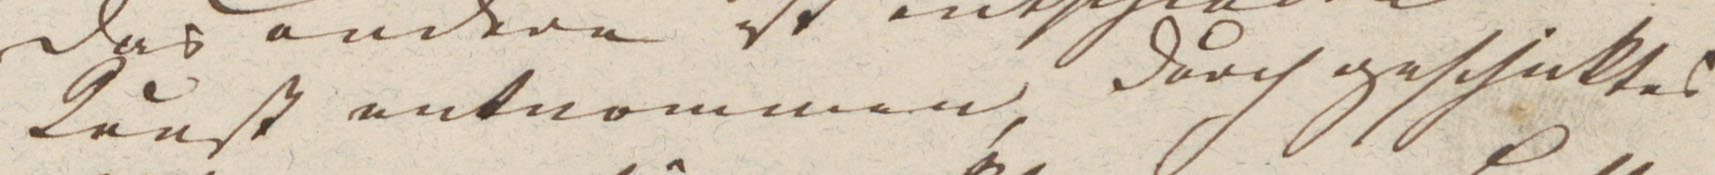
Kunst entnommen, durch geschicktes
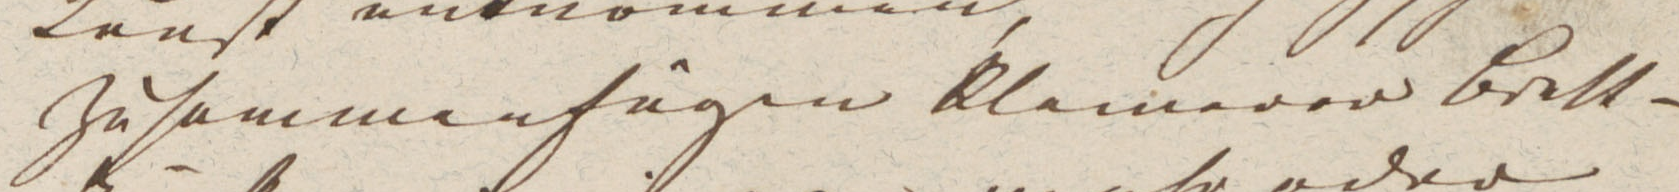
Zusammenfügen kleinerer Brett-
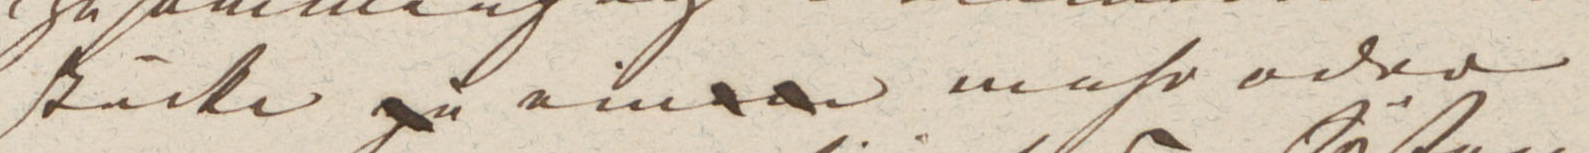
stücke zu einem mehr oder
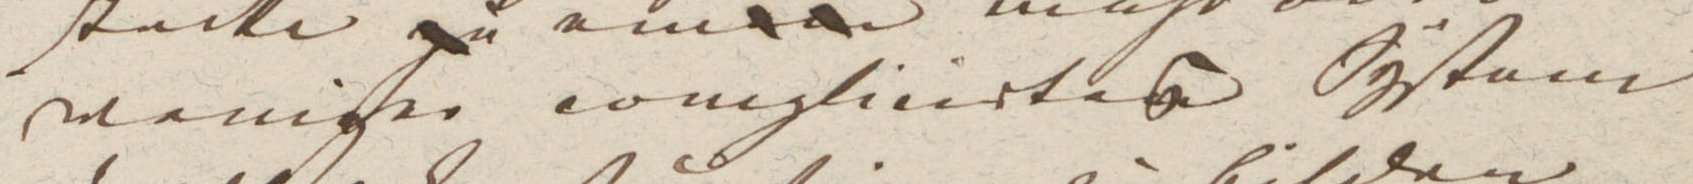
weniger complicirtens System
